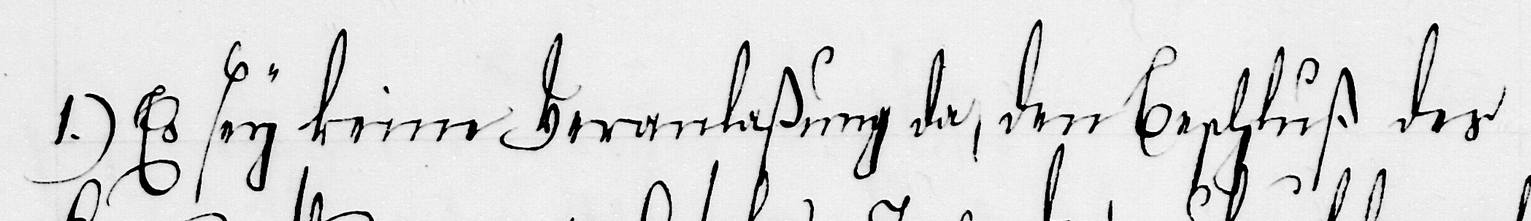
1.) Es sey keine Veranlaßung da, den Beschluß des
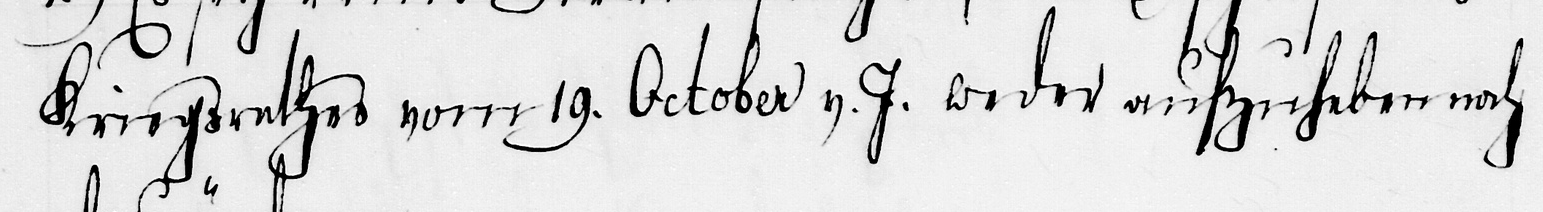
Kriegsrathes vom 19. October v. J.weder aufzuheben noch
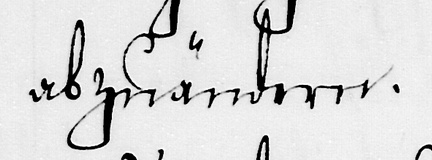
abzuändern.
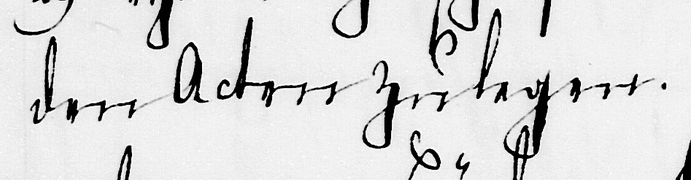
den Acten zu legen.
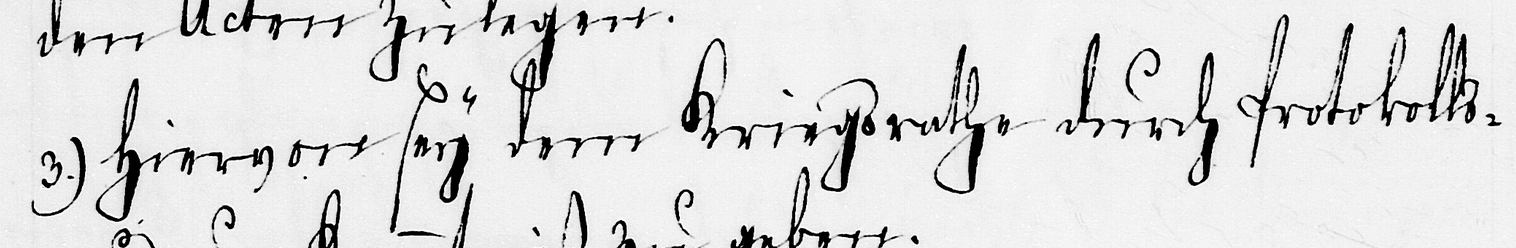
3.) Hiervon sey dem Kriegsrathe durch Protokoll¬
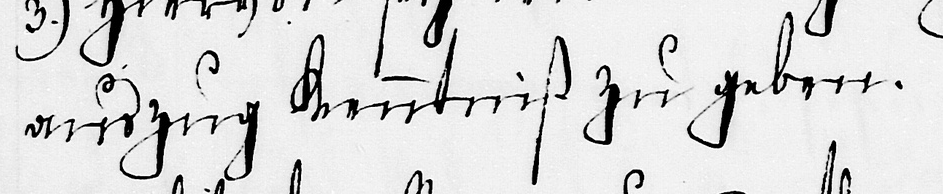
sauszug Kenntniß zu geben.
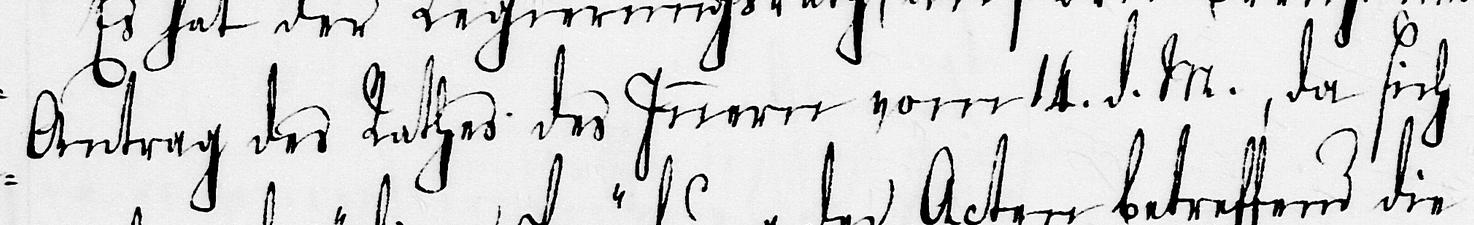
Antrag des Rathes des Innern vom 14. d. M., da sich
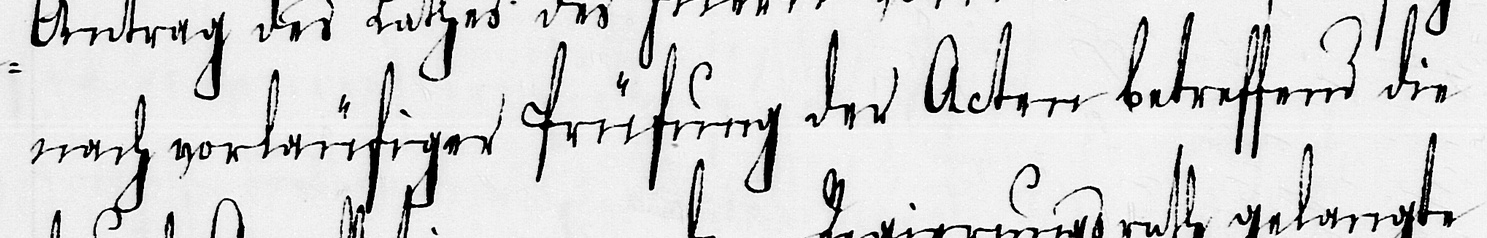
nach vorläufiger Prüfung der Acten betreffend die
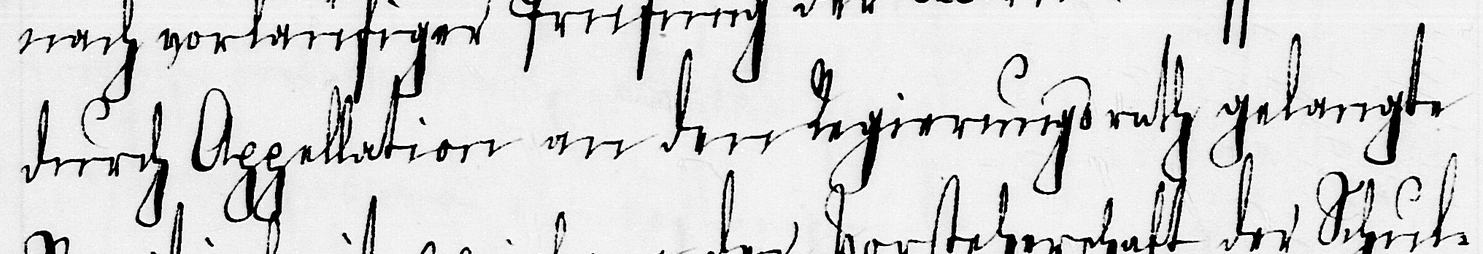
durch Appellation an den Regierungsrath gelangte
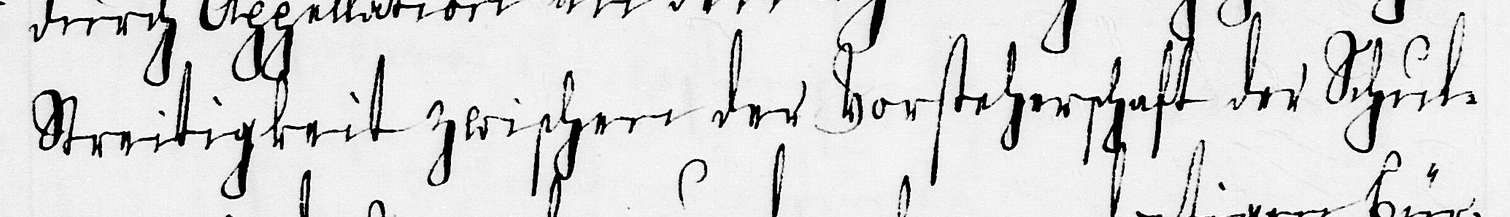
Streitigkeit zwischen der Vorsteherschaft der Schul¬
